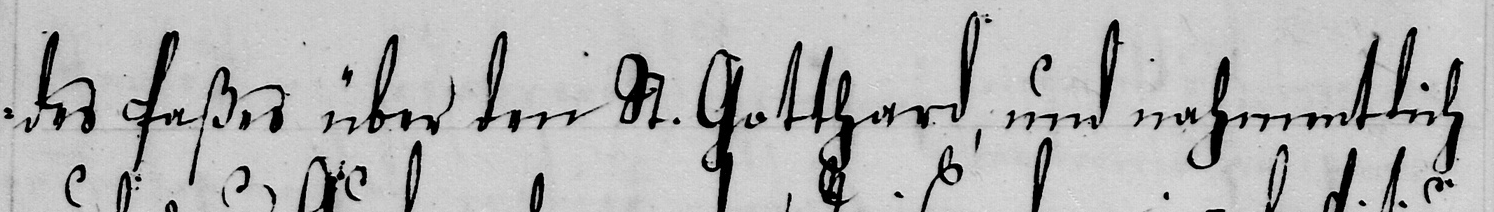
des Paßes über den St. Gotthard, und nahmentlich
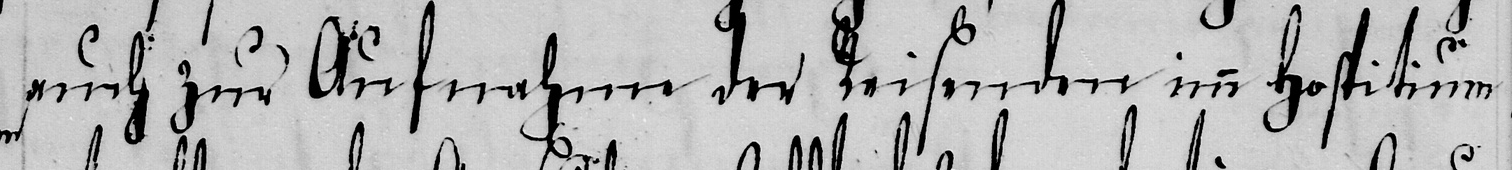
auch zur Aufnahme der Reisenden im Hospitium
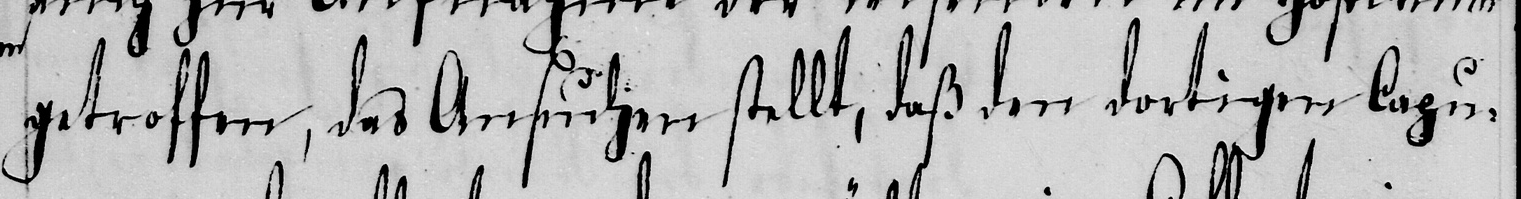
getroffen, das Ansuchen stellt, daß den dortigen Capu¬
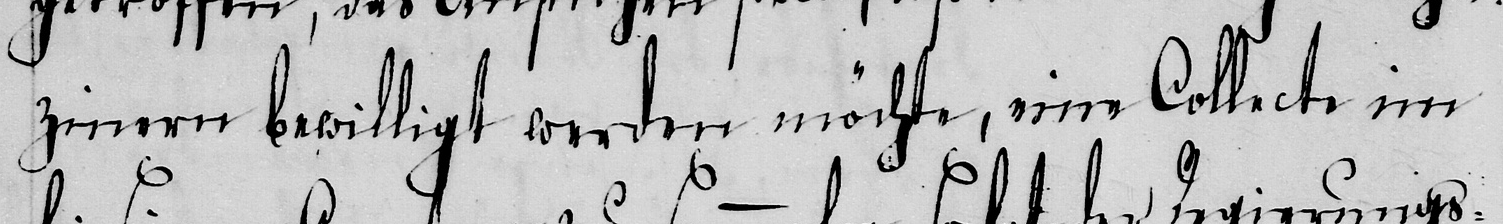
zinern bewilligt werden möchte, eine Collecte im
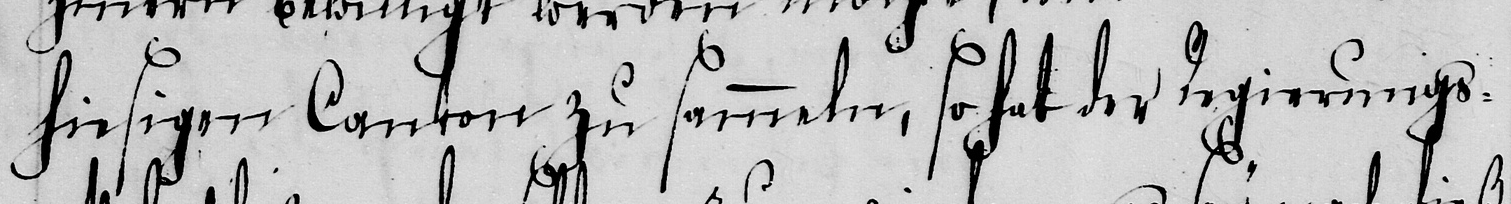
hiesigen Canton zu sammeln, so hat der Regierungs¬
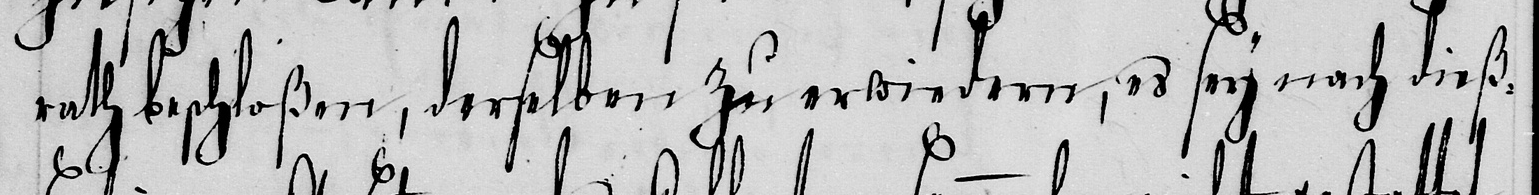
rath beschloßen, derselben zu erwiedern, es sey nach dieß¬
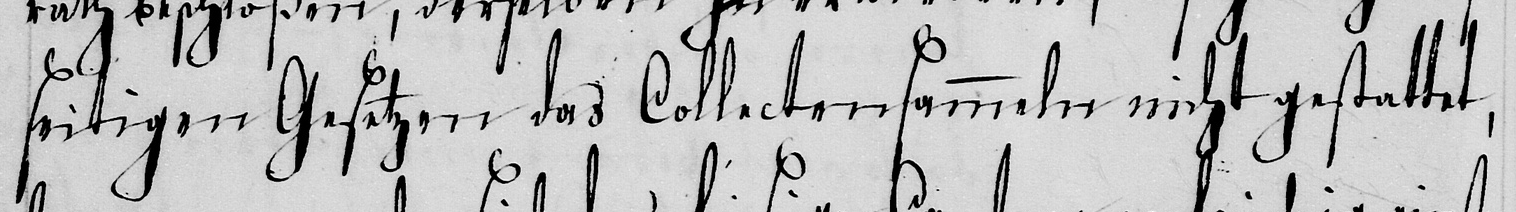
seitigen Gesetzen das Collectensammeln nicht gestatte¬
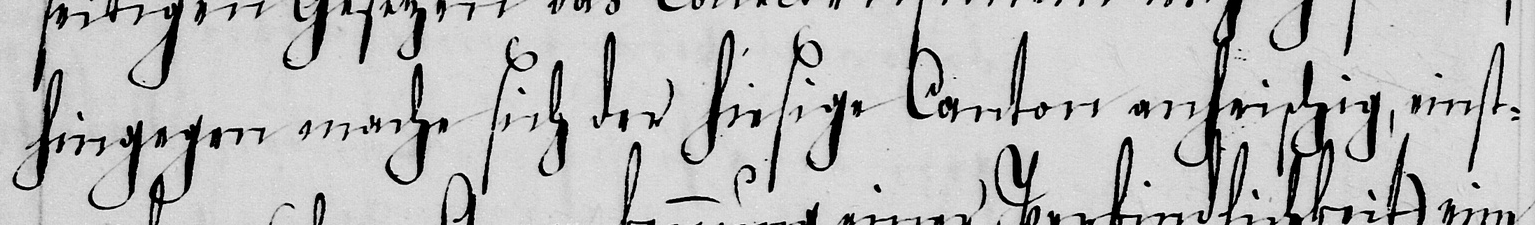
hingegen mache sich der hiesige Canton anheischig, eins¬
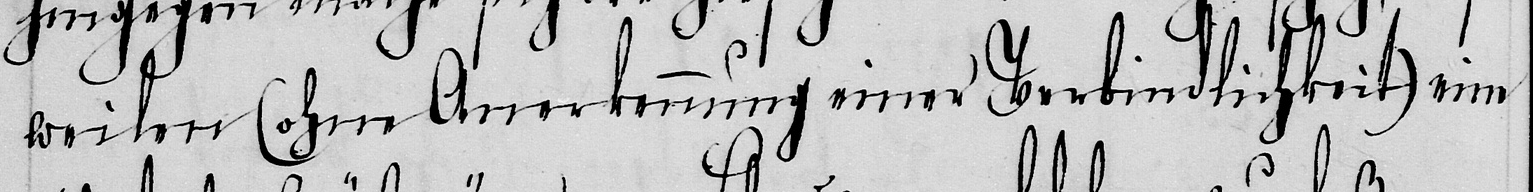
tweilen (ohne Anerkennung einer Verbindlichkeit) eine
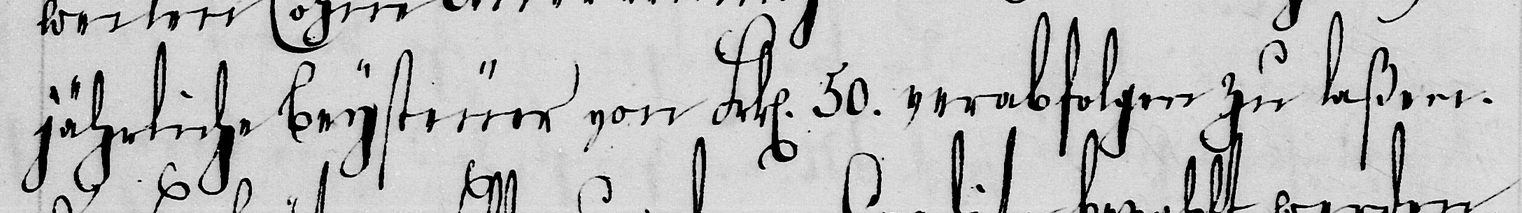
jährliche Beysteuer von Frk[en]. 50. verabfolgen zu laßen.
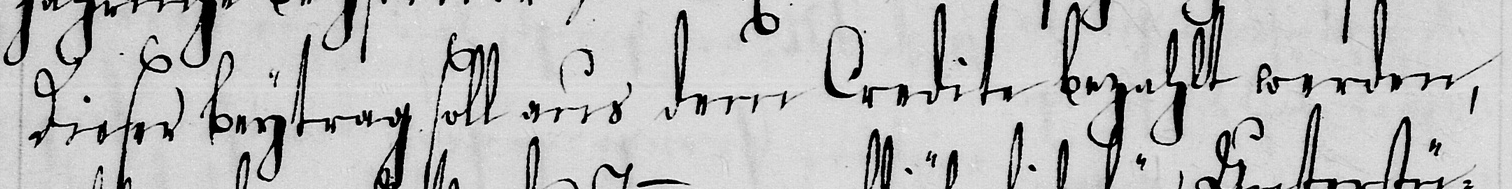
Dieser Beytrag soll aus dem Credite bezahlt werden,
